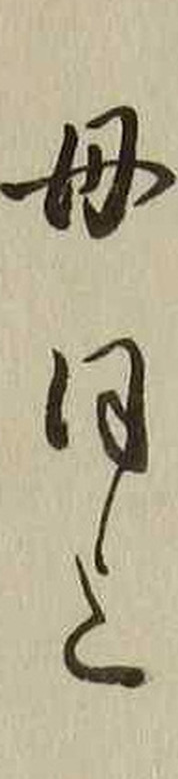母同上
